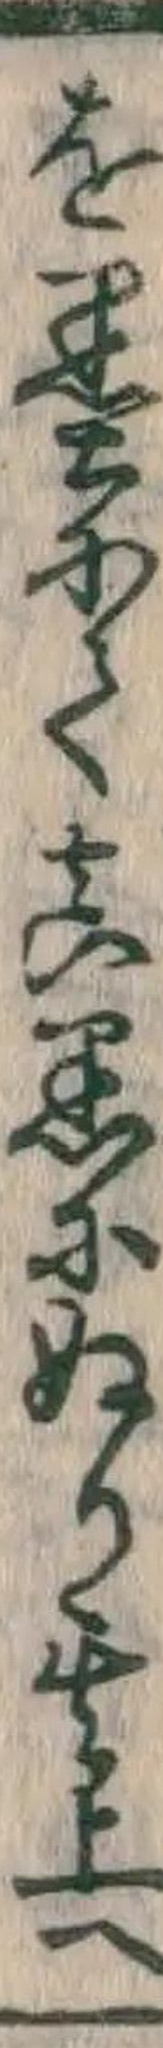を墨にて真黒にぬり其上へ
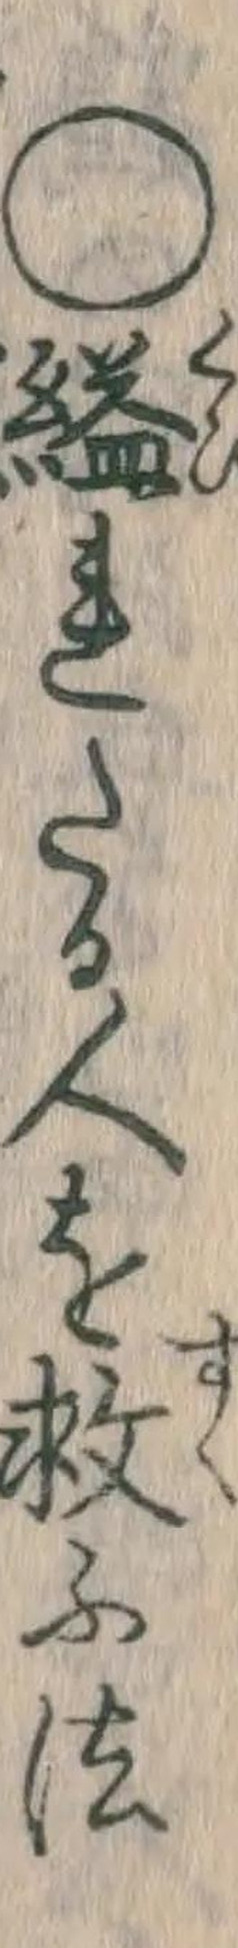○縊れたる人を救ふ法
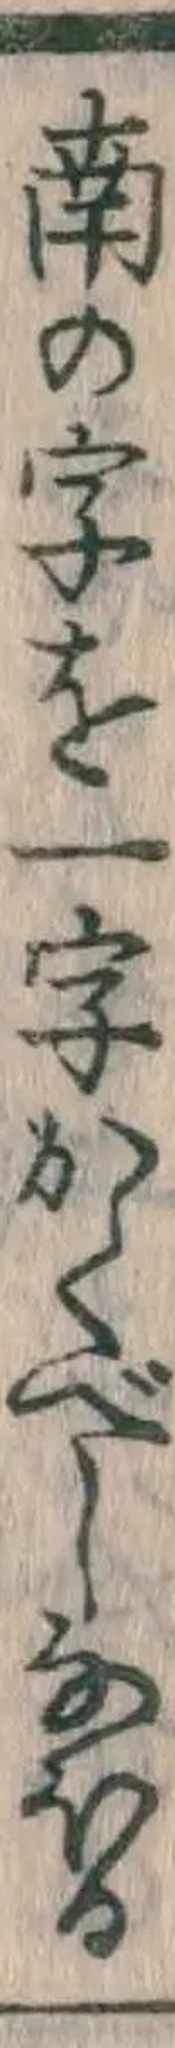南の字を一字かくべしなほる
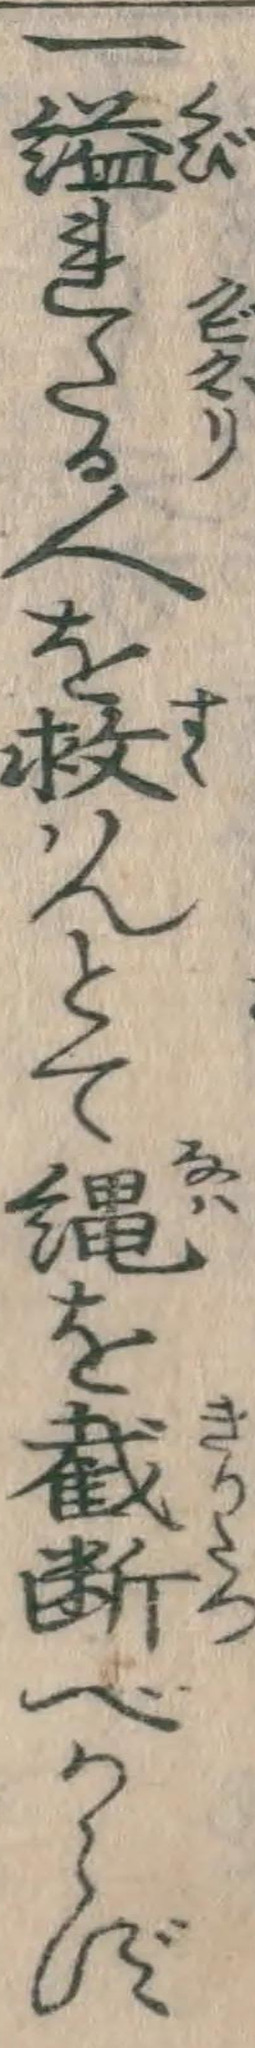一縊れたる人を救はんとて縄を截断べからず
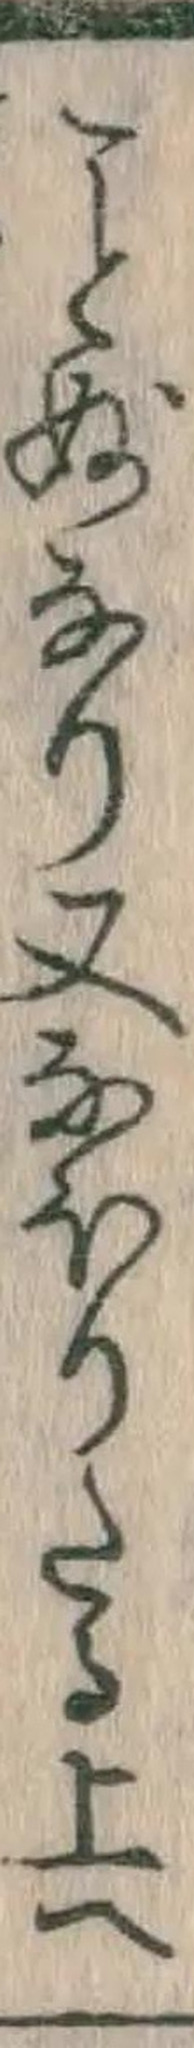こと妙なり又なほりたる上へ
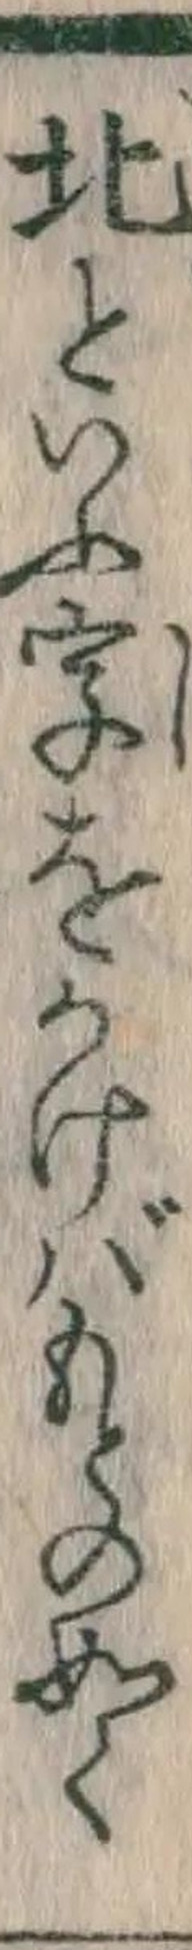北といふ字をかけばもとの如く
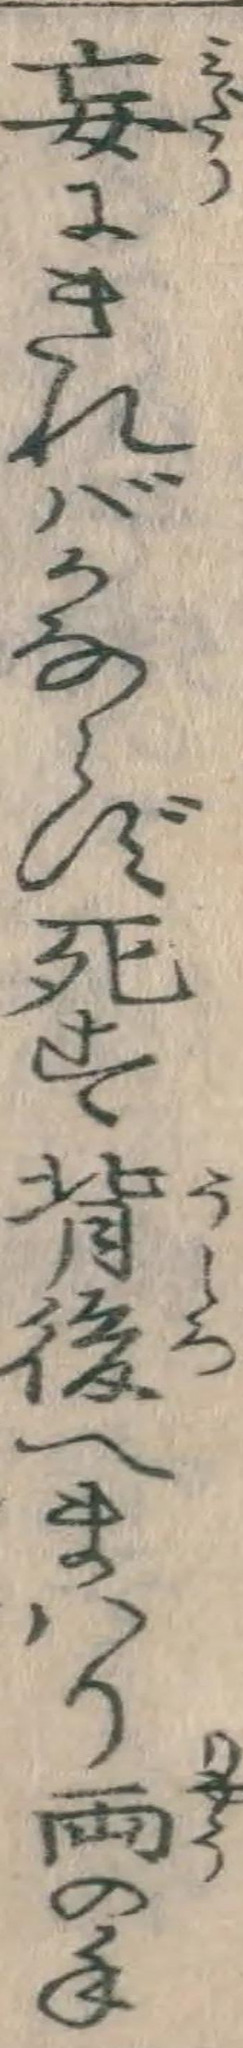妄にきればかならず死す背後へまはり両の手
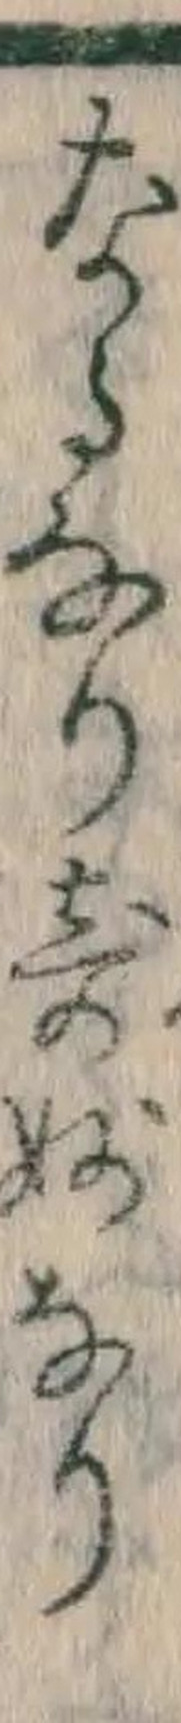なるなり奇妙なり
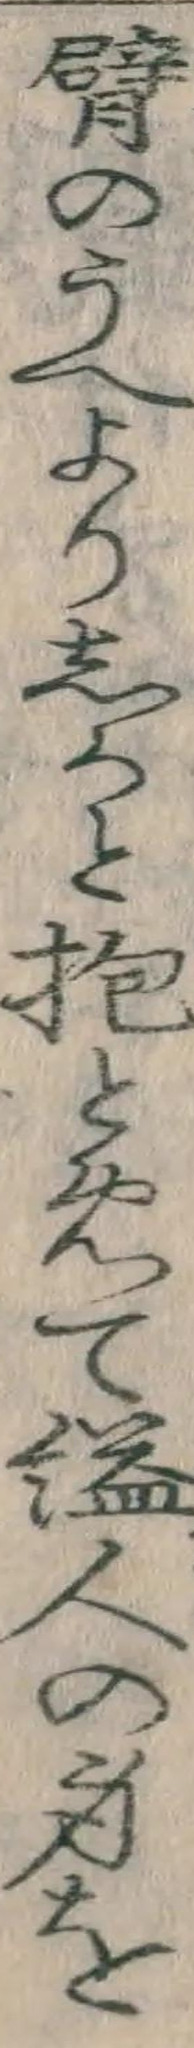臂のうへよりしかと抱とめて縊人の身を
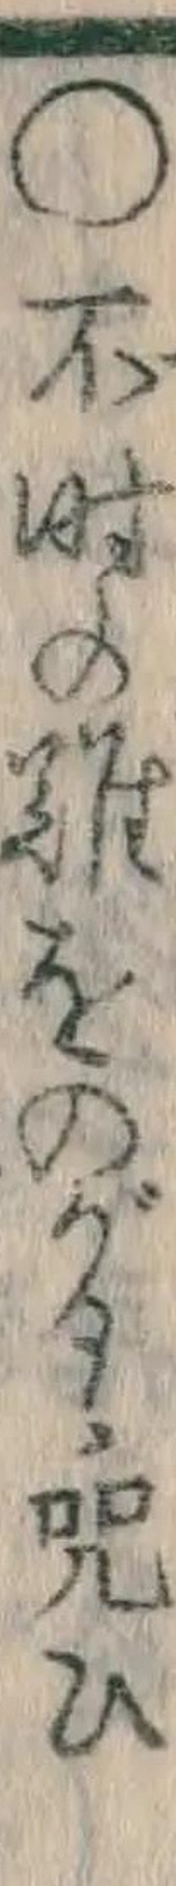○不時の難をのがるゝ呪ひ
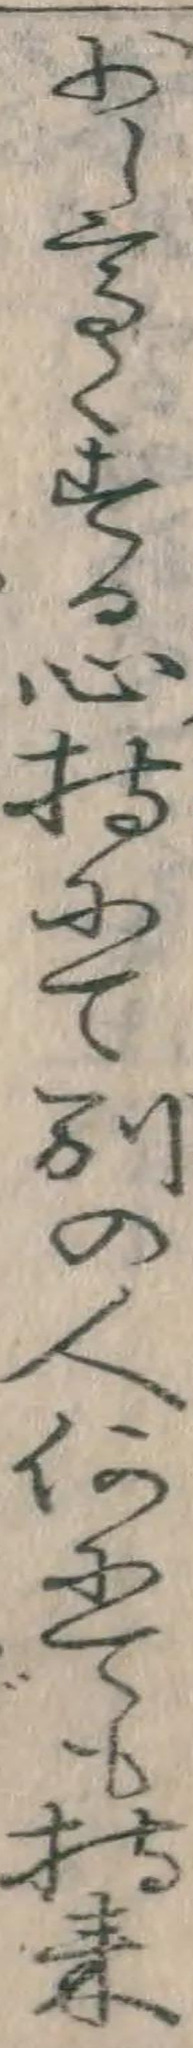少し高くする心持にて別の人何にても持来
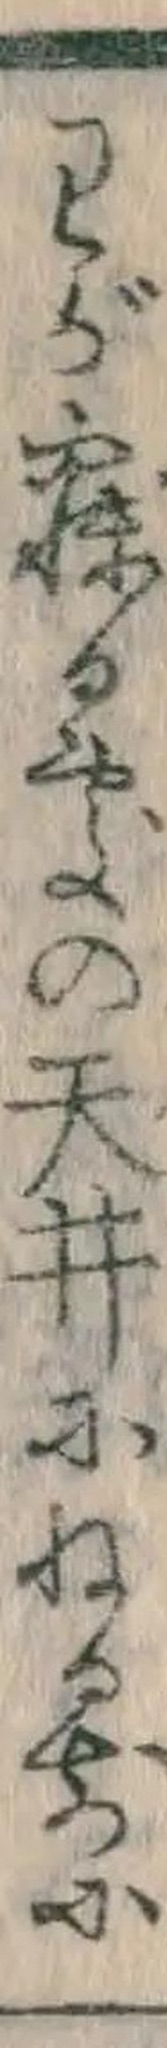わが寝る処の天井にねる前に
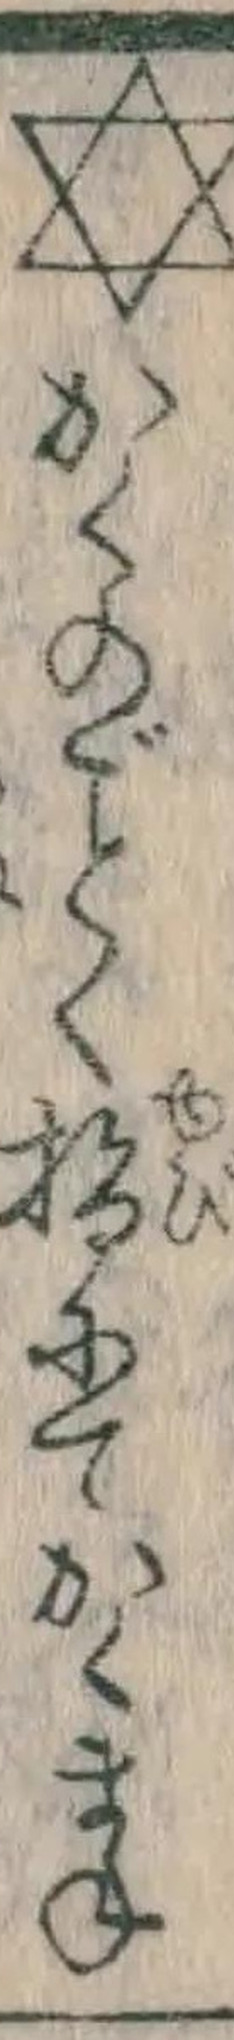✡かくのごとく指にてかくまね
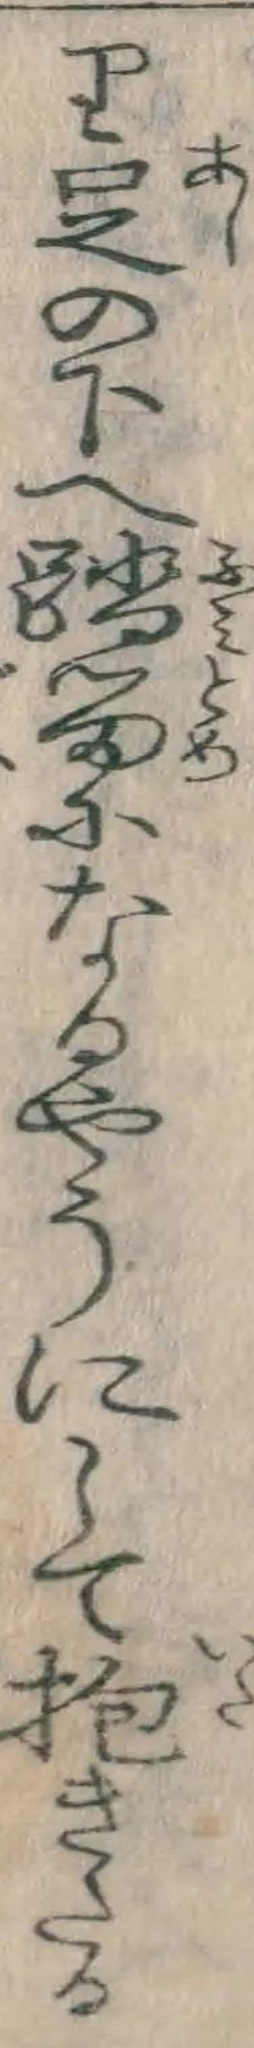り足の下へ踏留になるやうにして抱きたる
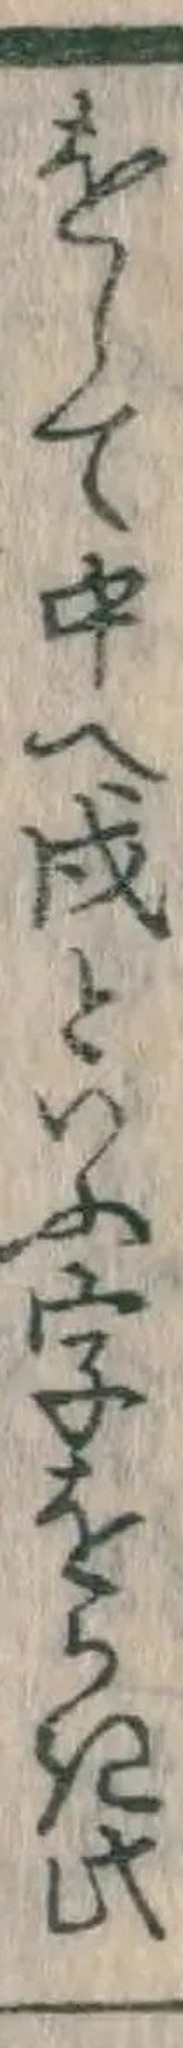をして中へ戌といふ字をかき此
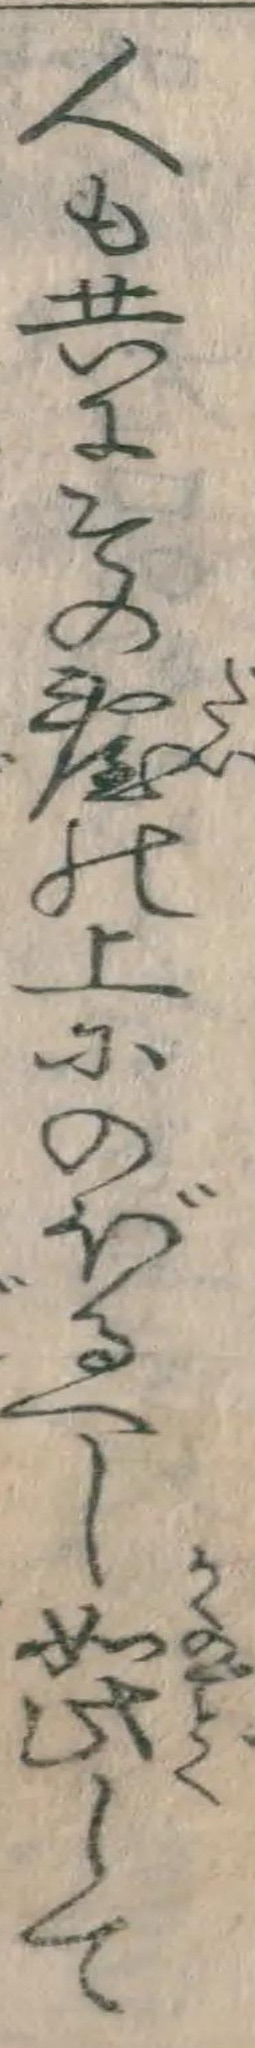人も共にその台の上にのぼるへし如此して
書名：広益秘事大全 3巻. [4]
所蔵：国立国会図書館 National Diet Library, JAPAN
